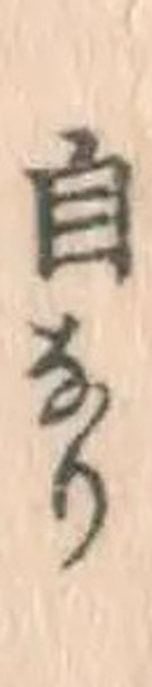自なり
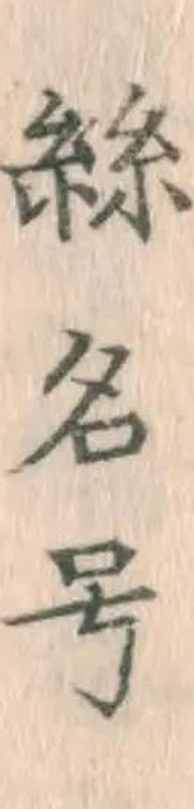糸名号
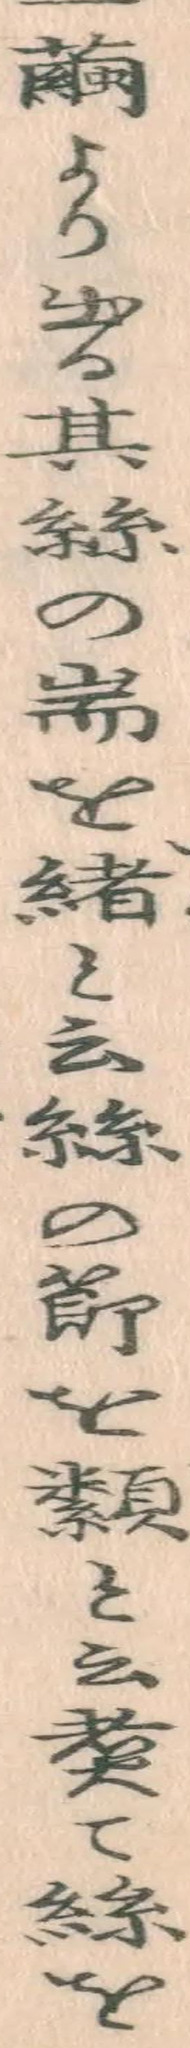一繭より出る其糸の耑を緒と云糸の節を纇と云煮て糸を
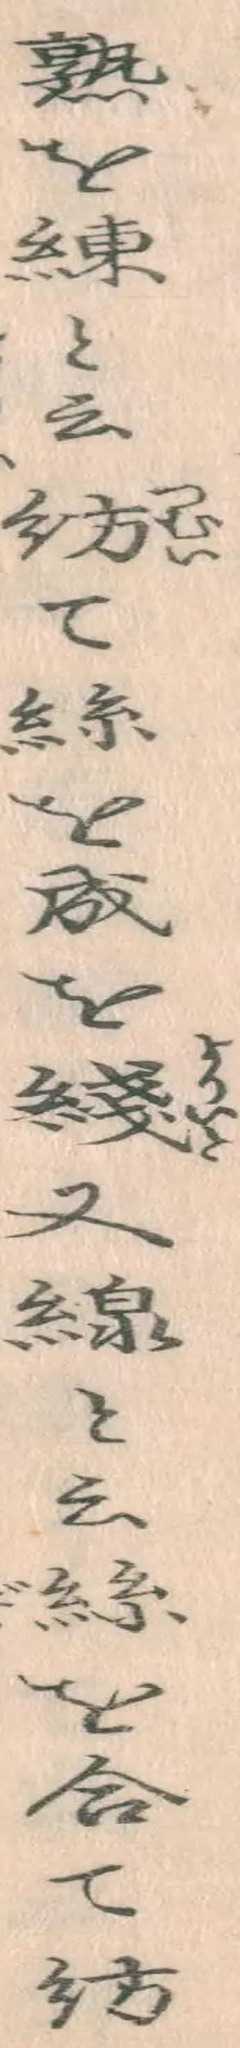熟を練と云紡て糸を成を綫又線と云糸を合て紡
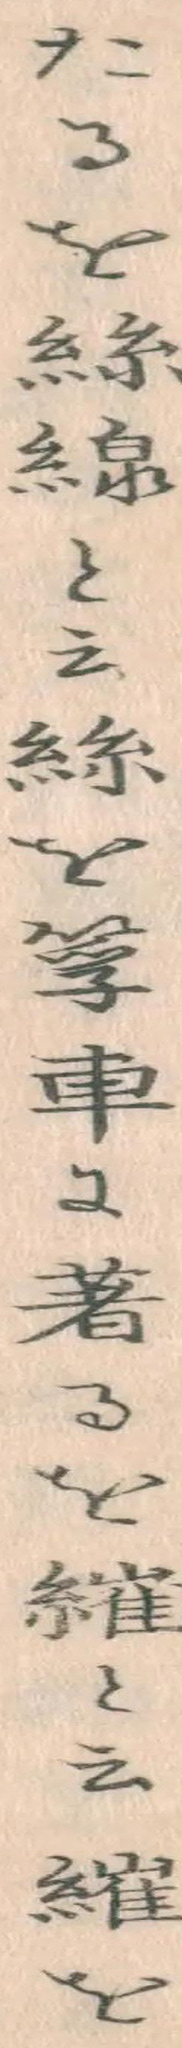たるを糸線と云糸を筟車に著るを繀と云繀を
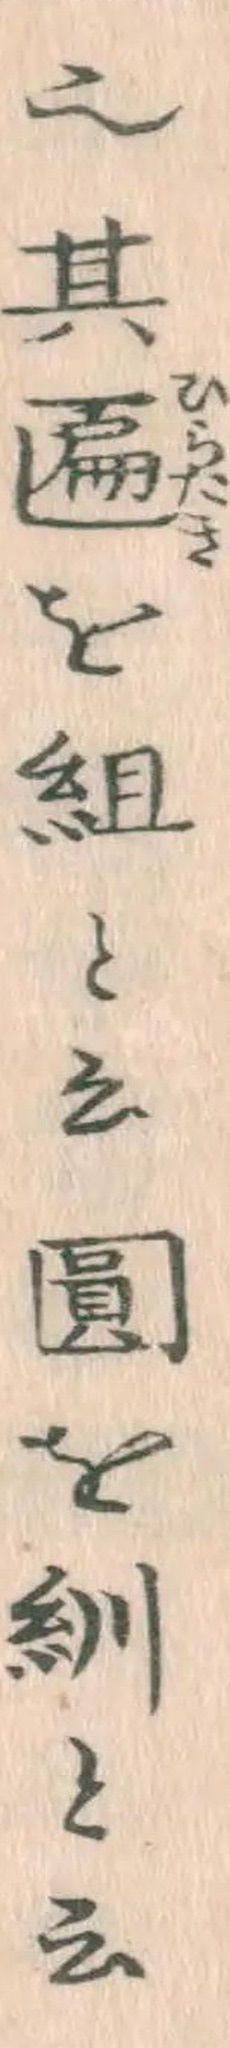也其匾を組と云円を紃と云
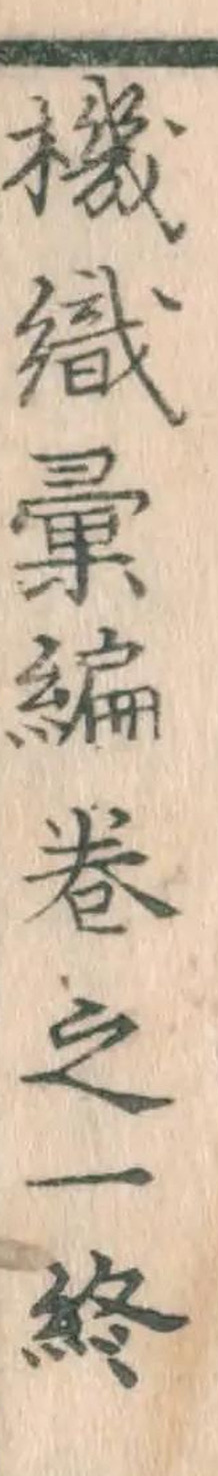機織彙編巻之一終

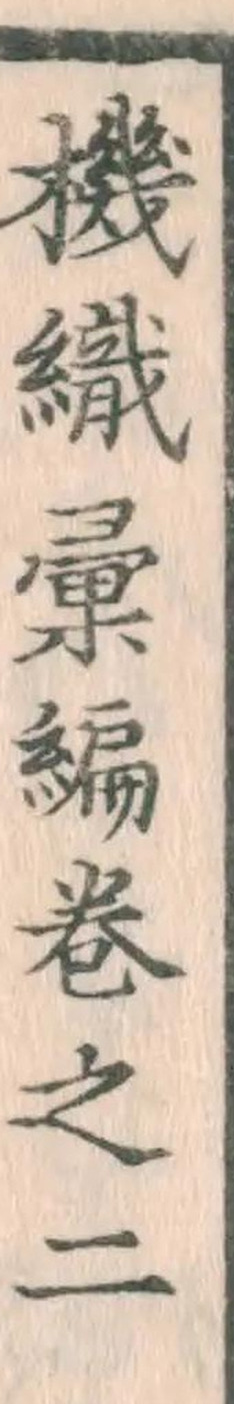機織彙編巻之二
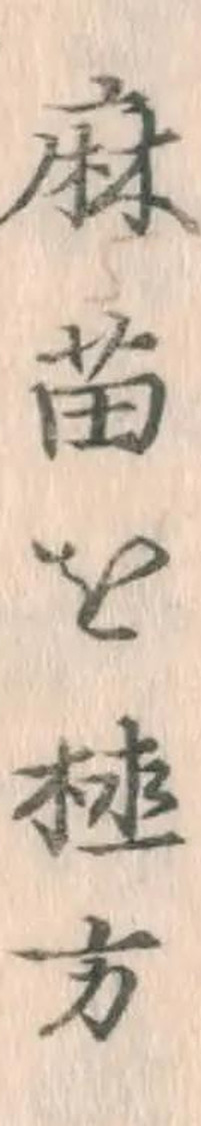麻苗を植方
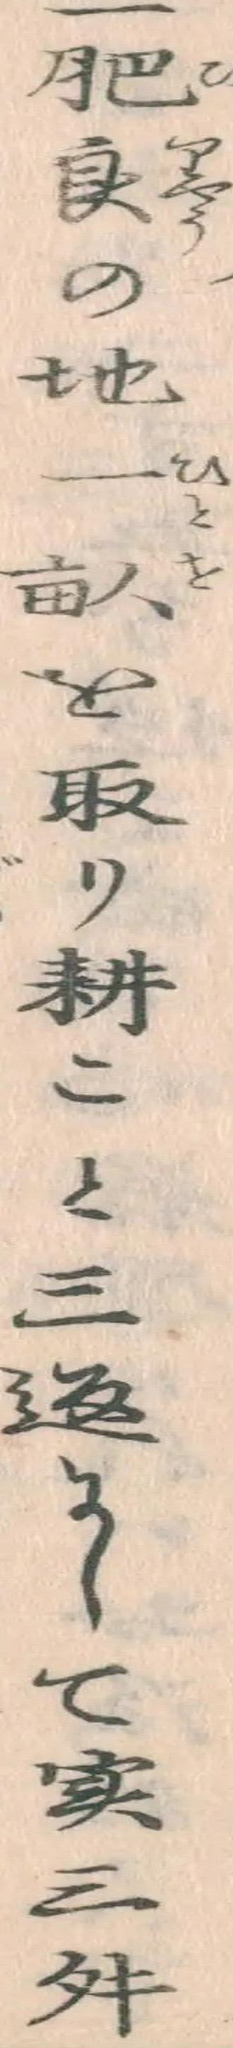一肥良の地一畝を取り耕こと三返にして実三升
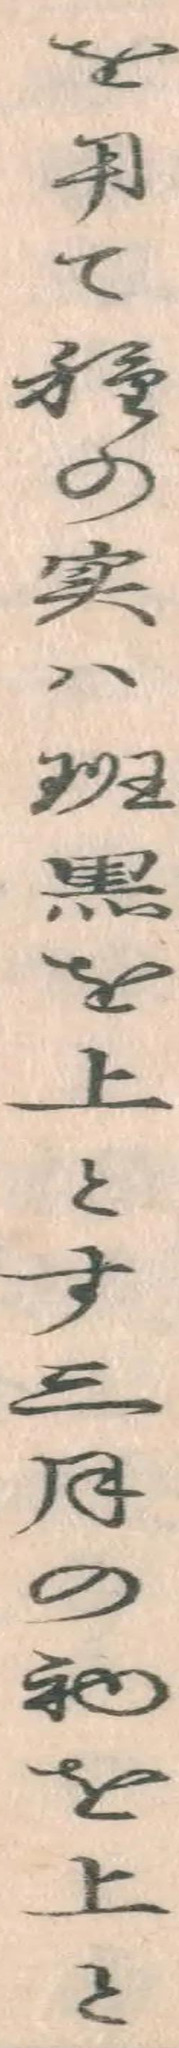を用て種の実は班黒を上とす三月の初を上と
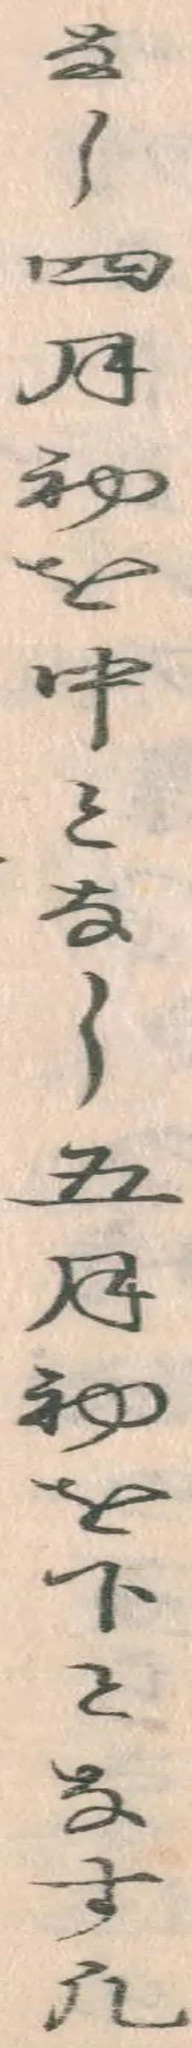なし四月初を中となし五月初を下となす凡
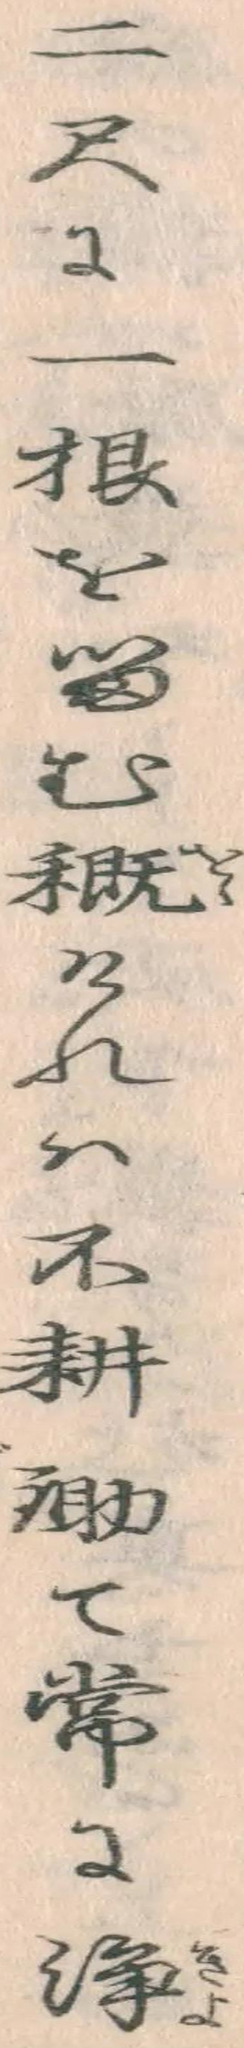二尺に一根を留む穊けれは不耕鋤て常に浄
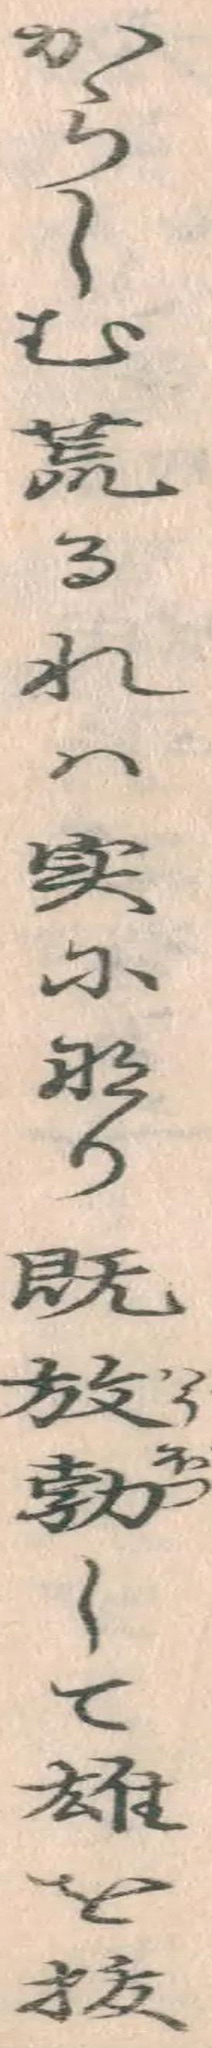からしむ荒るれは実になり既放勃して雄を抜
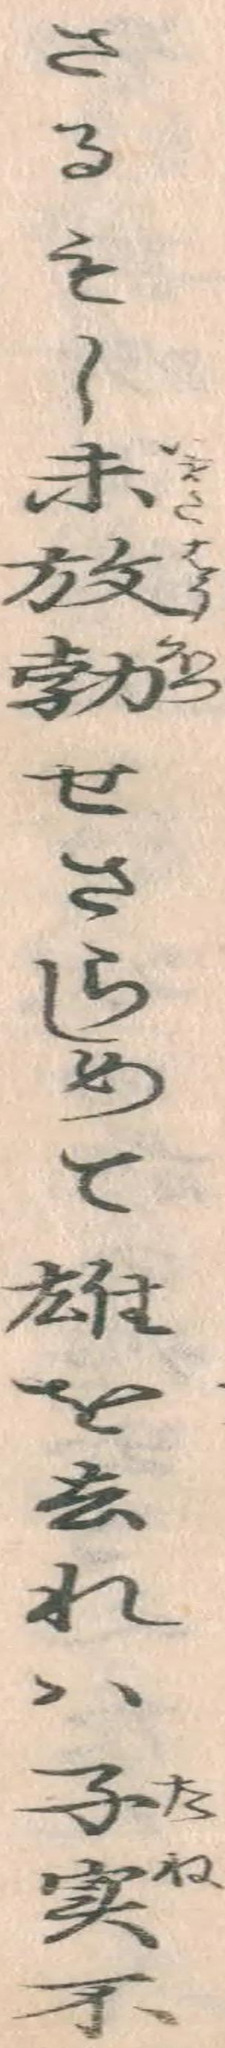さるもし未放勃せさらしめて雄を去れは子実不
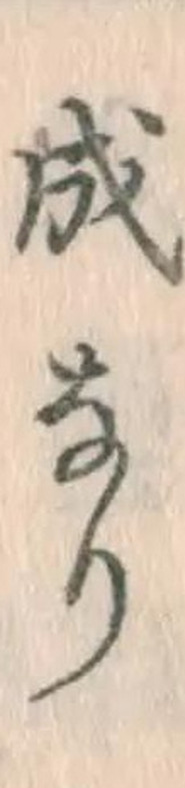成なり
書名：機織彙編 5巻. [1]
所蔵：国立国会図書館 National Diet Library, JAPAN
